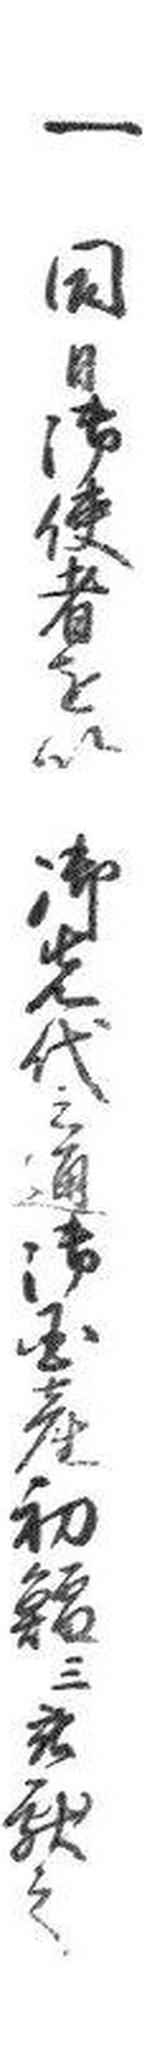一同日御使者を以御先代之通御国産初鱈三被献之
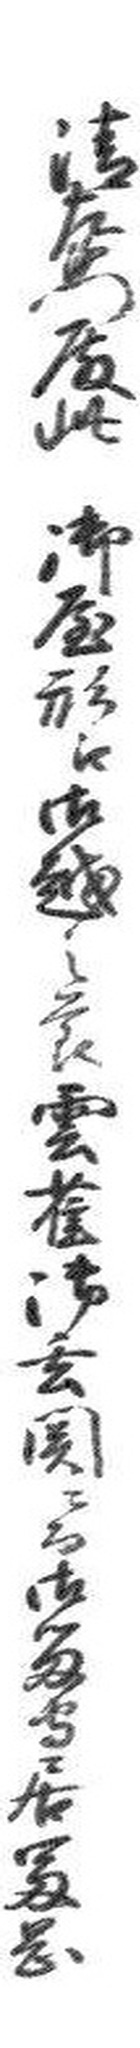清左衛門殿此御屋形江御越之節雲雀御玄関ニ而御留守居富岡
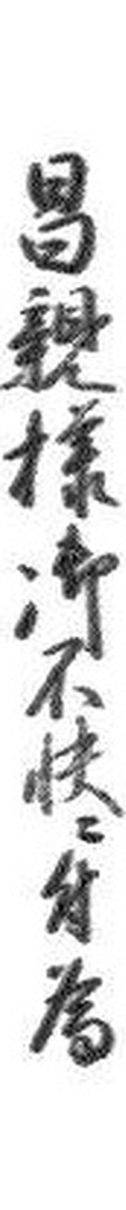昌親様御不快ニ付為
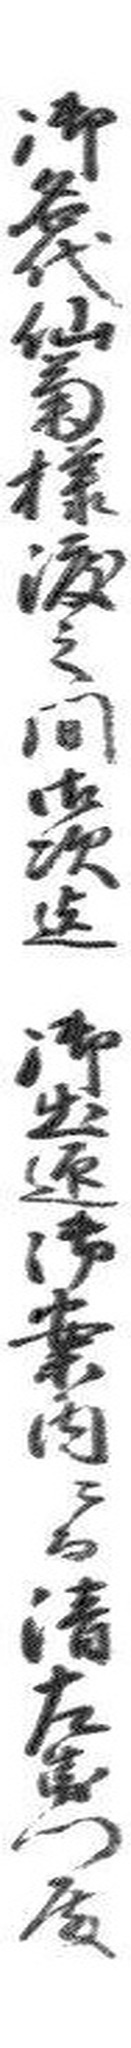御名代仙菊様渡之間御次迄御出迎御案内ニ而清左衛門殿
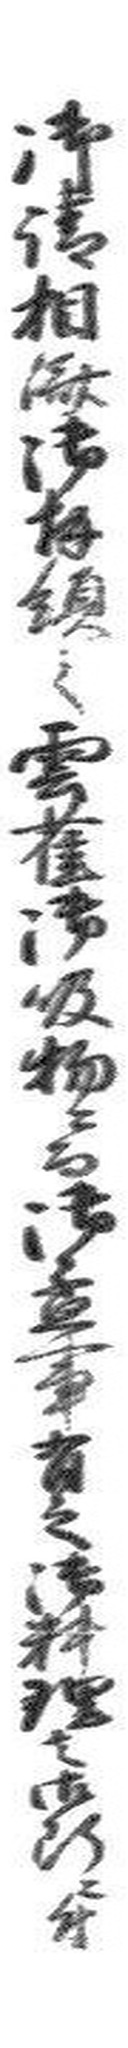御請相済御拝領之雲雀御吸物ニ而御盃事有之御料理者御断ニ付
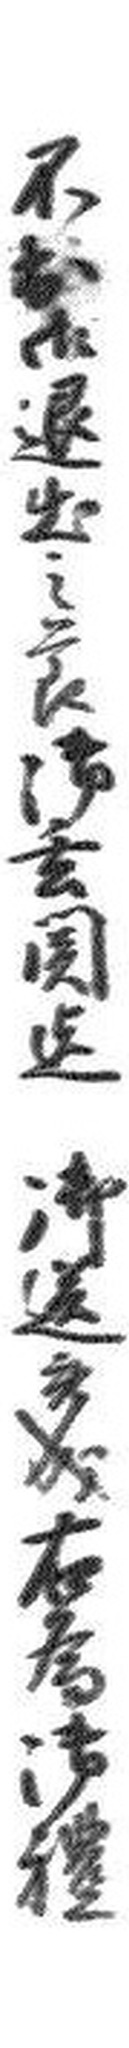不出御退出之節御玄関迄御送被成右為御礼
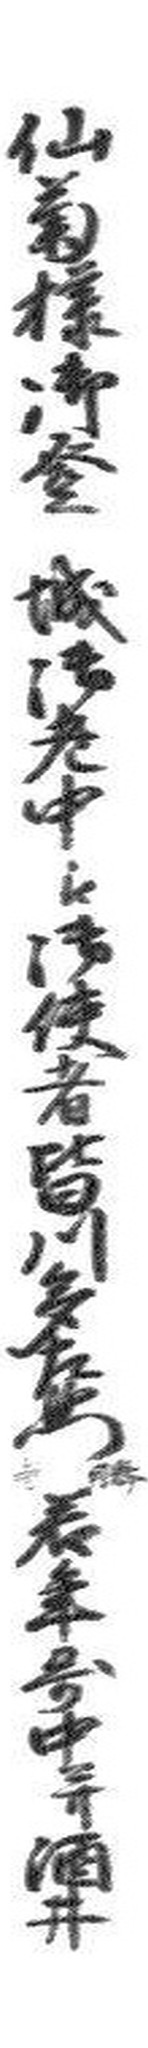仙菊様御登城御老中江御使者皆川多左衛門若年寄中并酒井
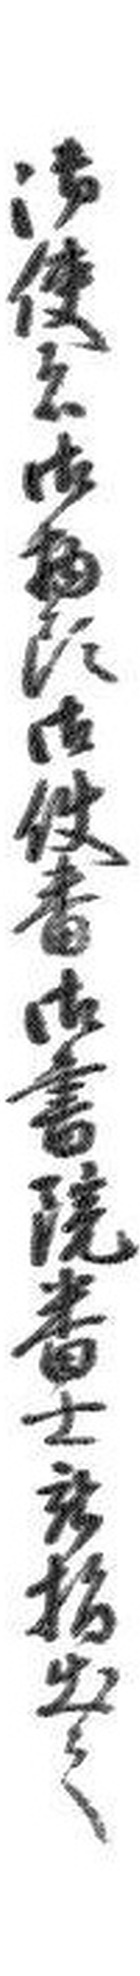御使者御物頭御使番御書院番士被指出之
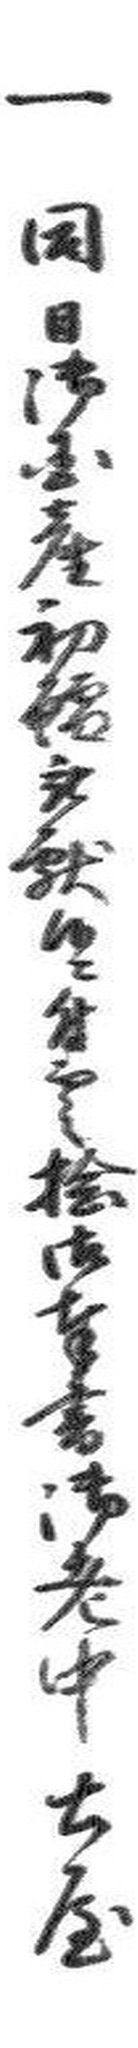一同日御国産初鱈被献候ニ付而之捻御奉書御老中土屋

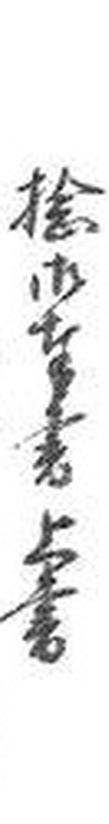捻御奉書上書
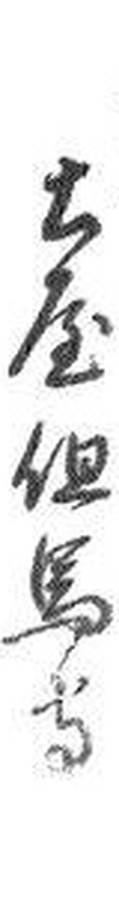土屋但馬守
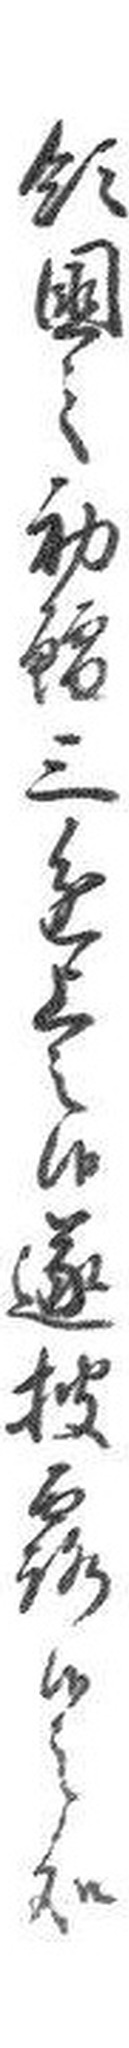領国之初鱈三進上之候遂披露候之処
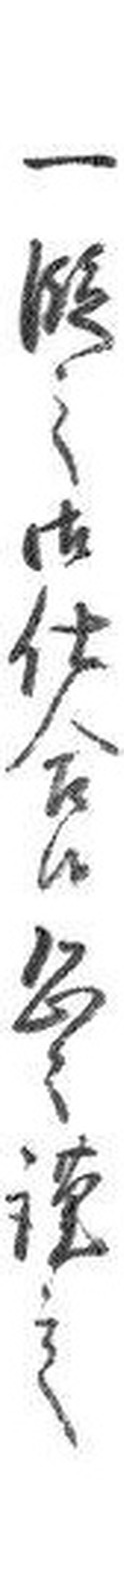一段之御仕合候恐々謹言
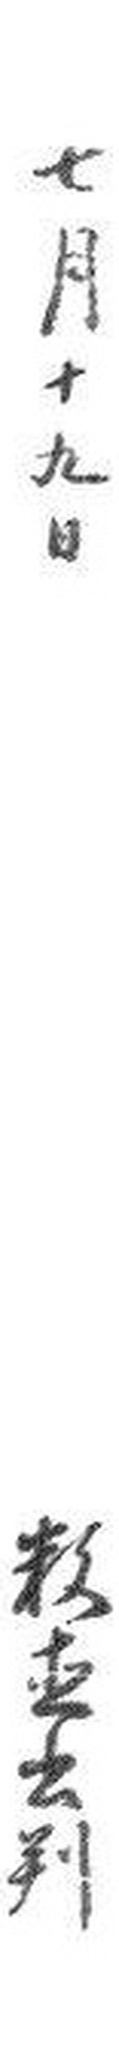七月十九日数直書判
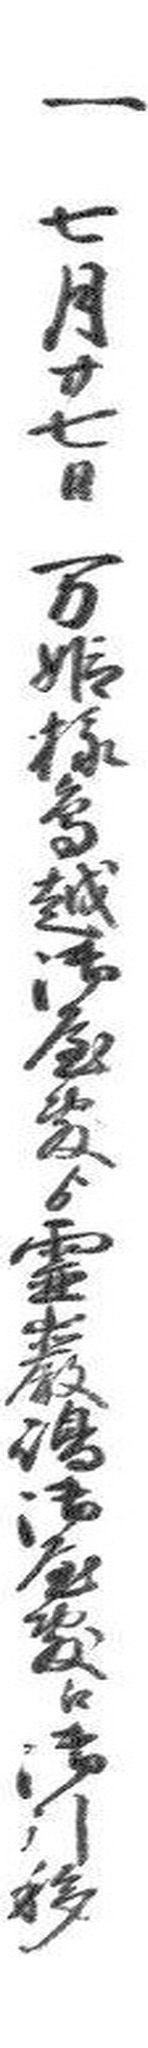一七月廿七日万姫様鳥越御屋敷ゟ霊岸嶋御屋敷江御引移
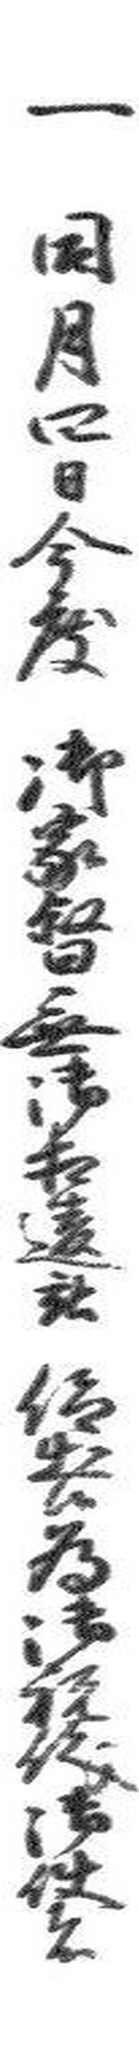一同月四日今度御家督無御相違被仰出候為御祝儀御使者
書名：家譜 十一 昌親公 従延宝二年到延宝四年八月
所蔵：福井県文書館 Fukui Prefectural Archives
